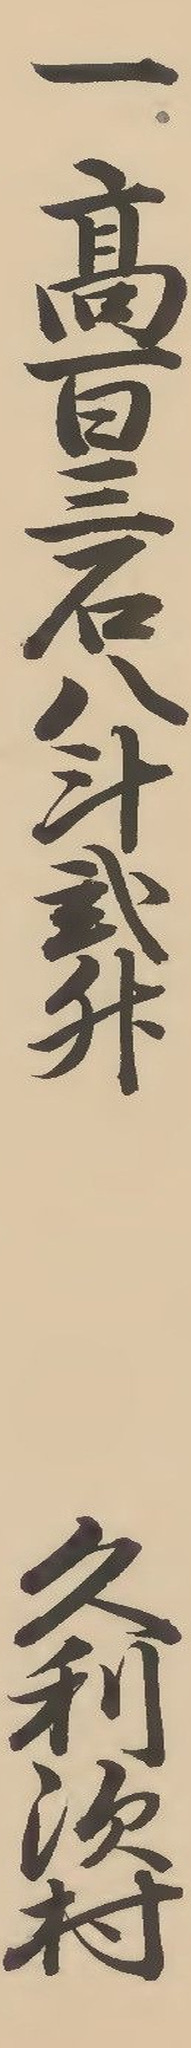一高百三石八斗弐升久利須村
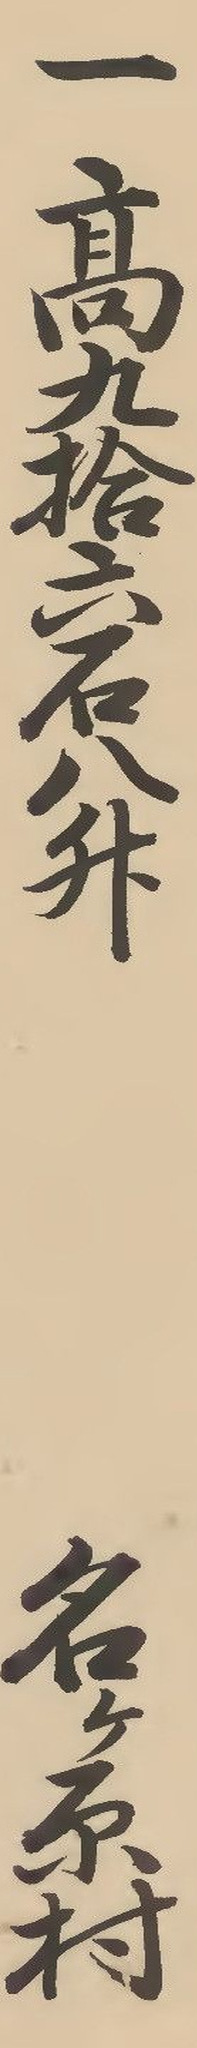一高九拾六石八升名ヶ原村
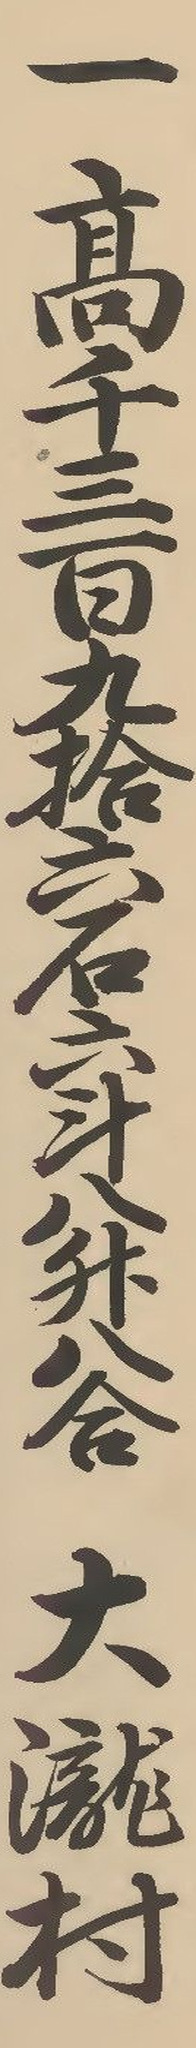一高千三百九拾六石六斗八升八合大滝村
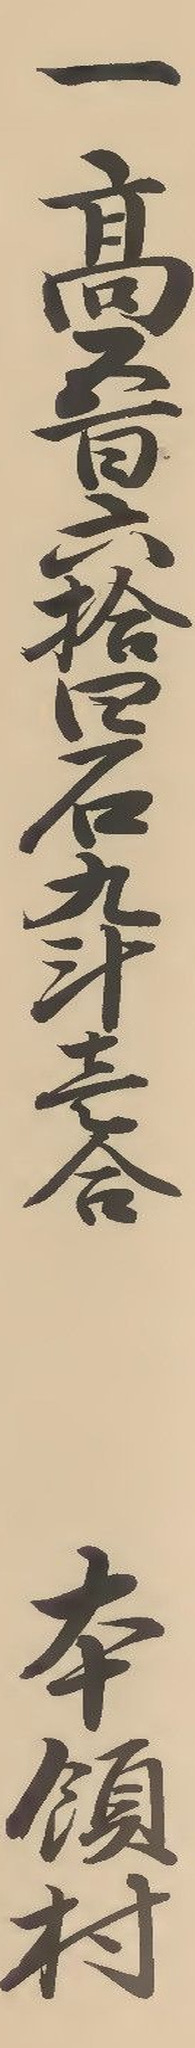一高五百六拾四石九斗壱合本領村
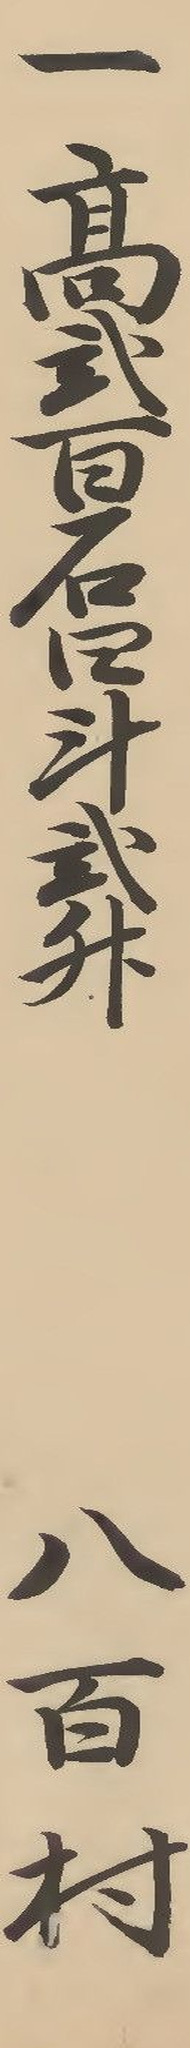一高弐百石四斗弐升八百村
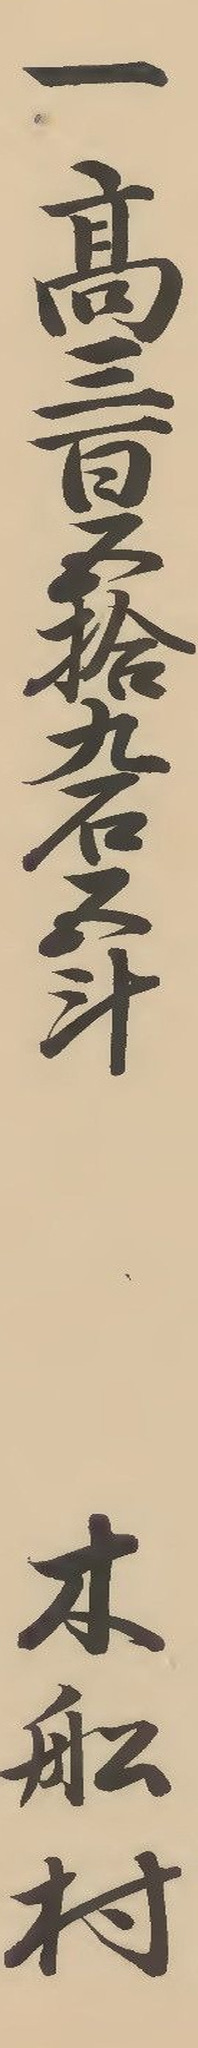一高三百五拾九石五斗木船村
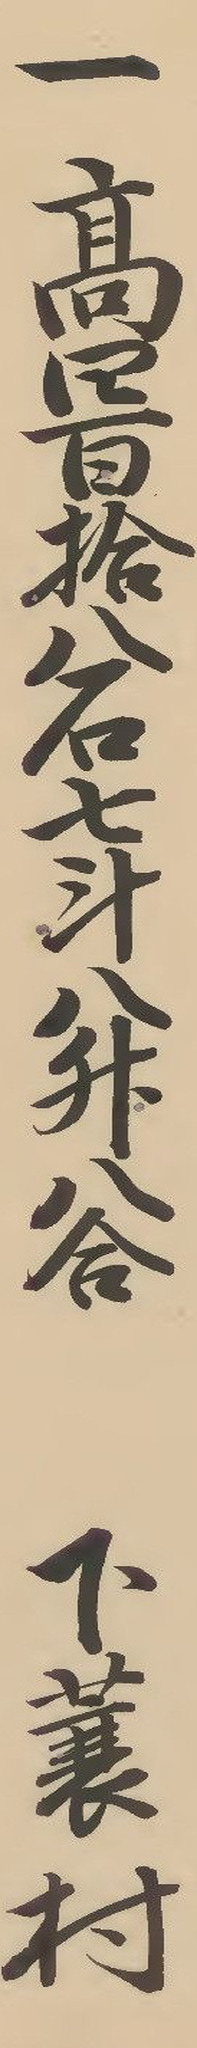一高四百拾八石七斗八升八合下蓑村

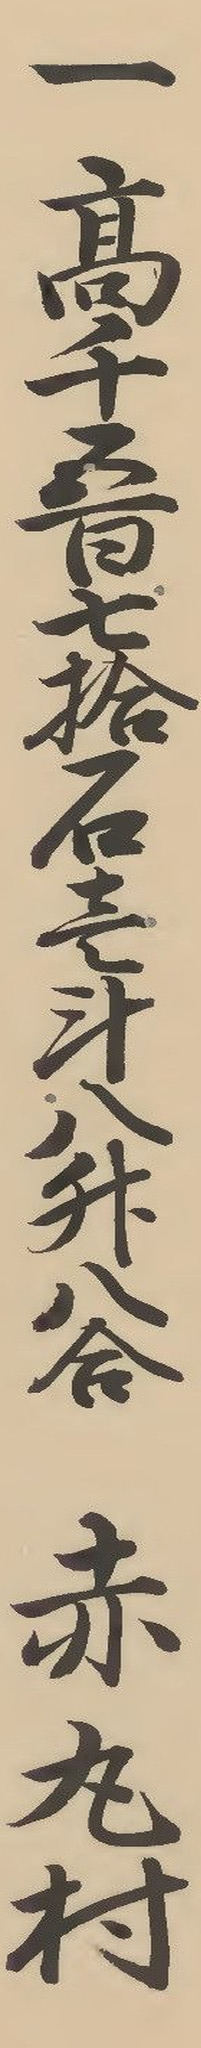一高千五百七拾石壱斗八升八合赤丸村
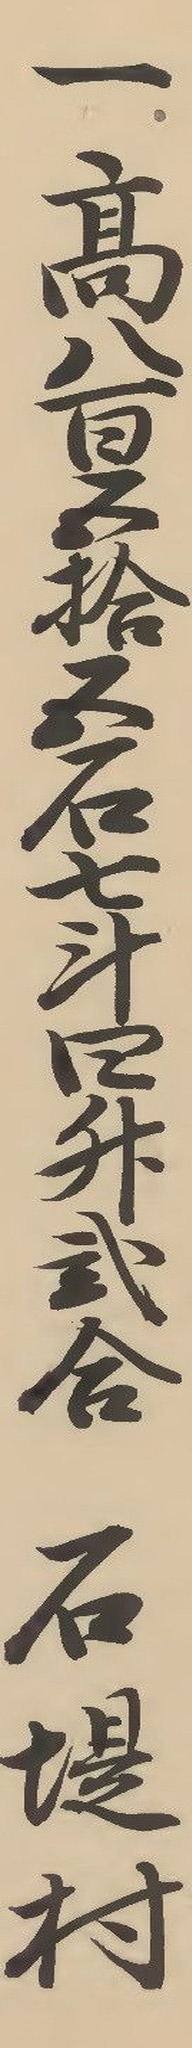一高八百五拾五石七斗四升弐合石堤村
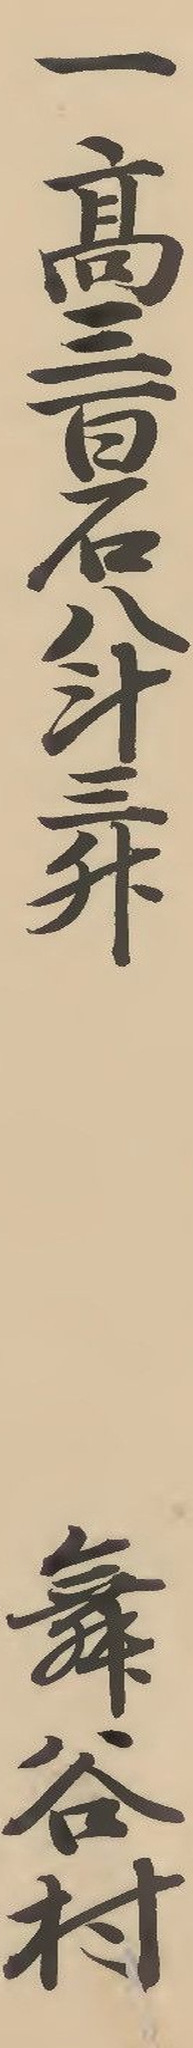一高三百石八斗三升舞谷村
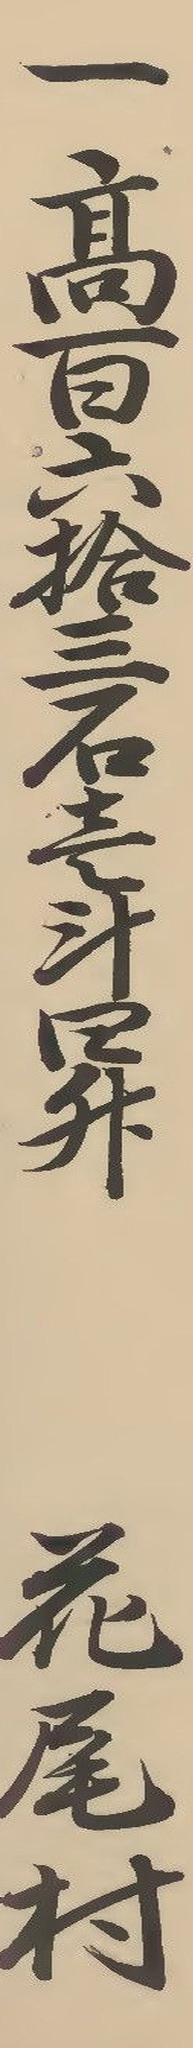一高百六拾三石壱斗四升花尾村
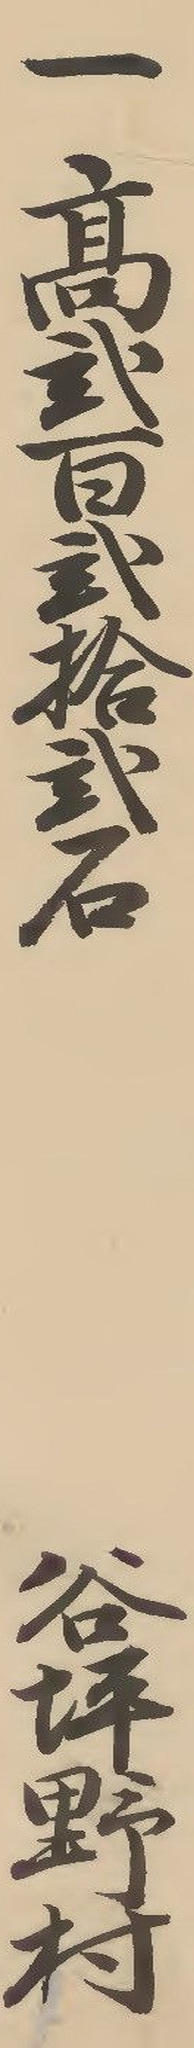一高弐百弐拾弐石谷坪野村
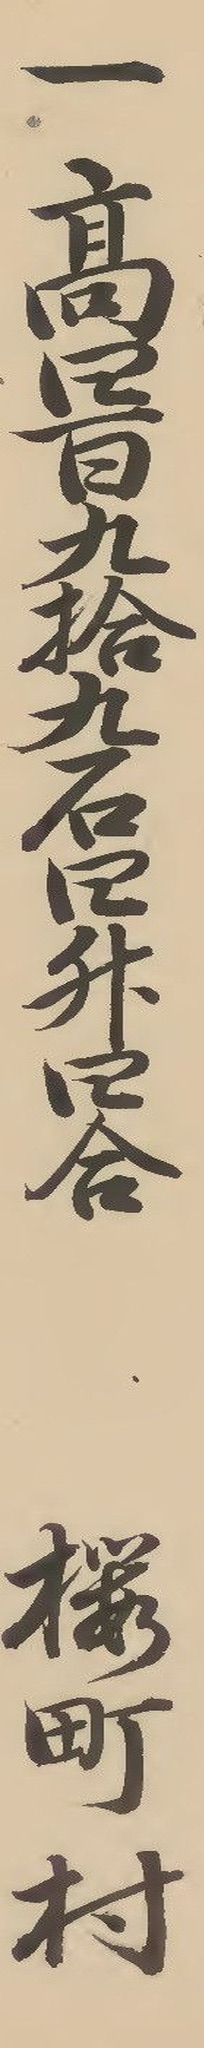一高四百九拾九石四升四合桜町村
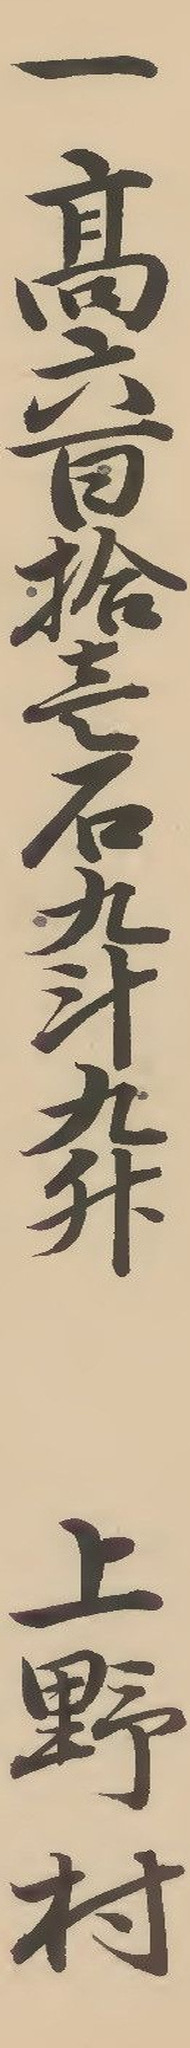一高六百拾壱石九斗九升上野村

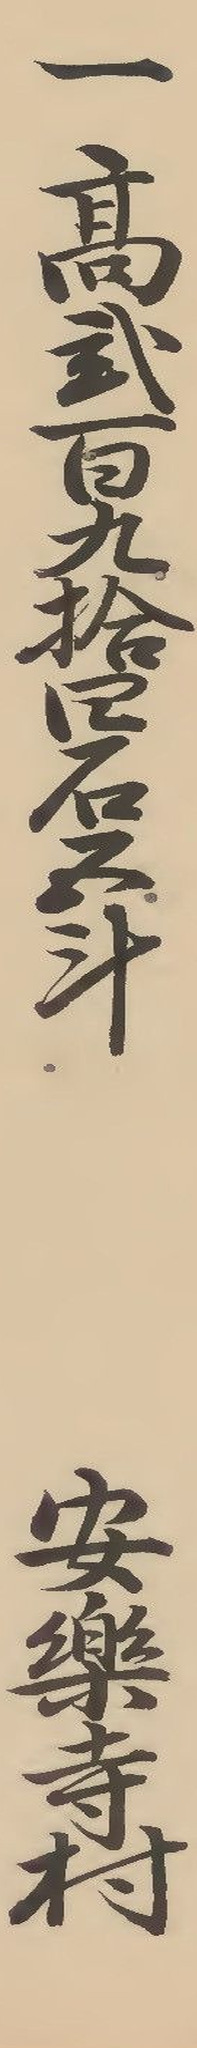一高弐百九拾四石五斗安楽寺村
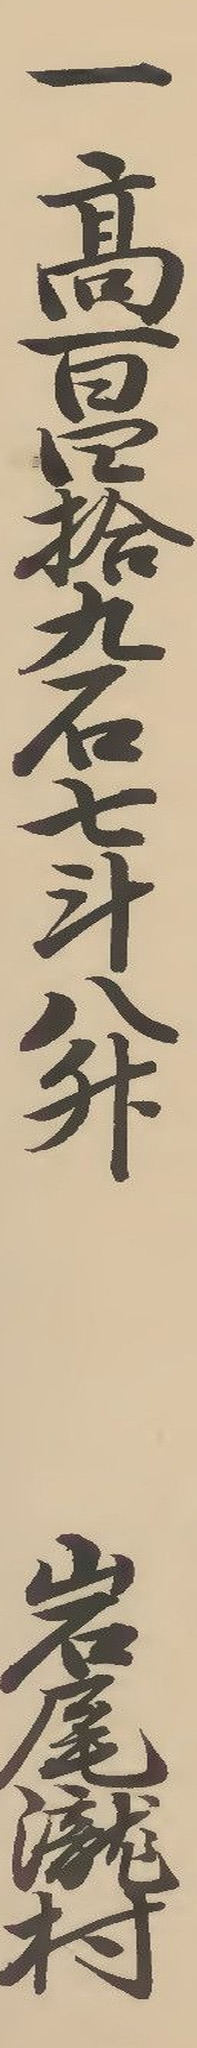一高百四拾九石七斗八升岩尾滝村
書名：越中国郷帳
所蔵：国立公文書館 National Archives of Japan
